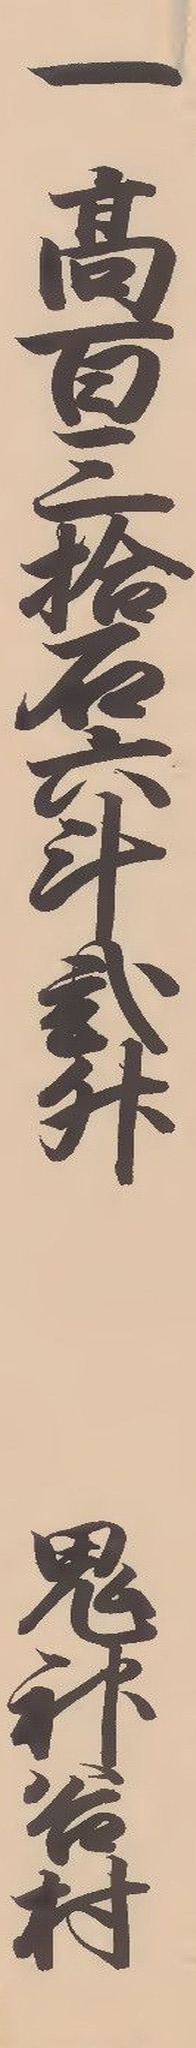一高百三拾石六斗弐升鬼神谷村
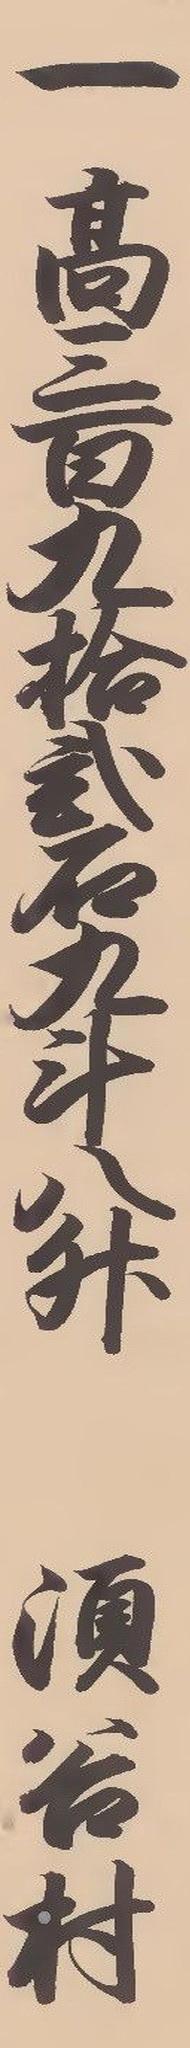一高三百九拾弐石九斗八升湏谷村
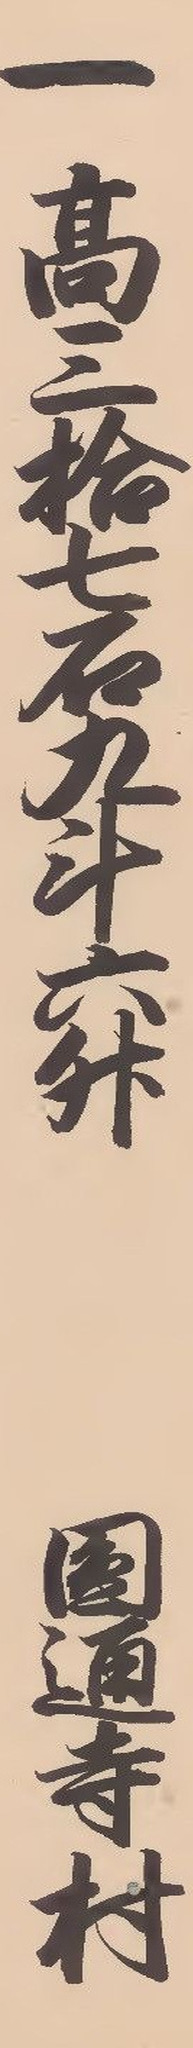一高三拾七石九斗六升円通寺村
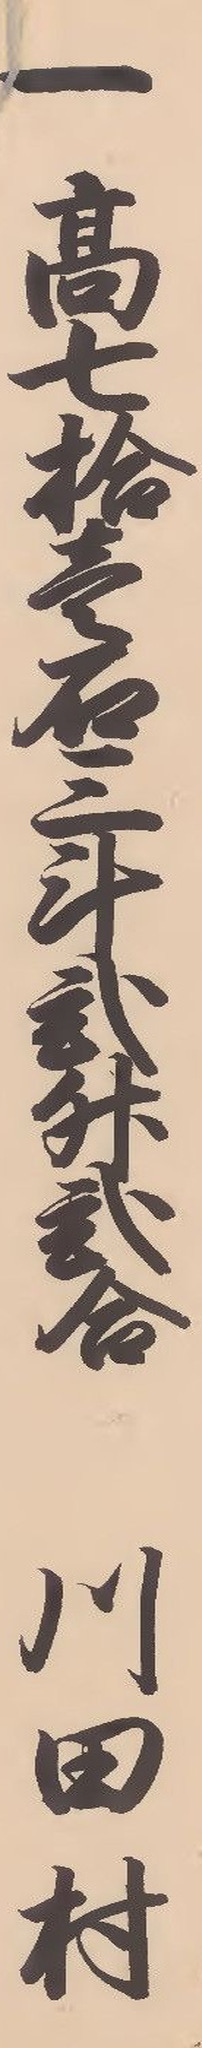一高七拾壱石三斗弐升弐合川田村
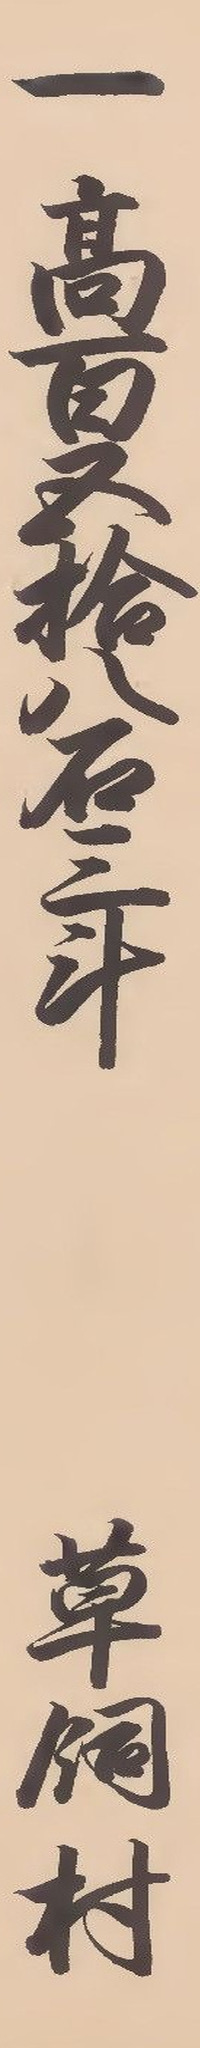一高百五拾八石三斗草飼村
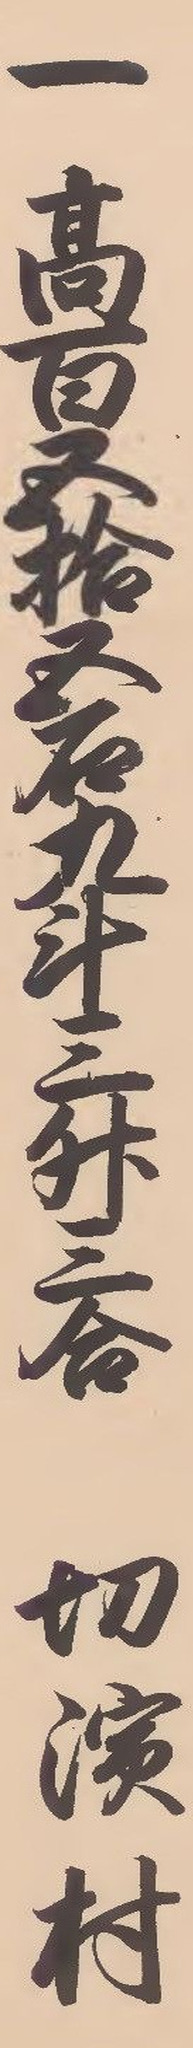一高百五拾五石九斗三升三合切浜村

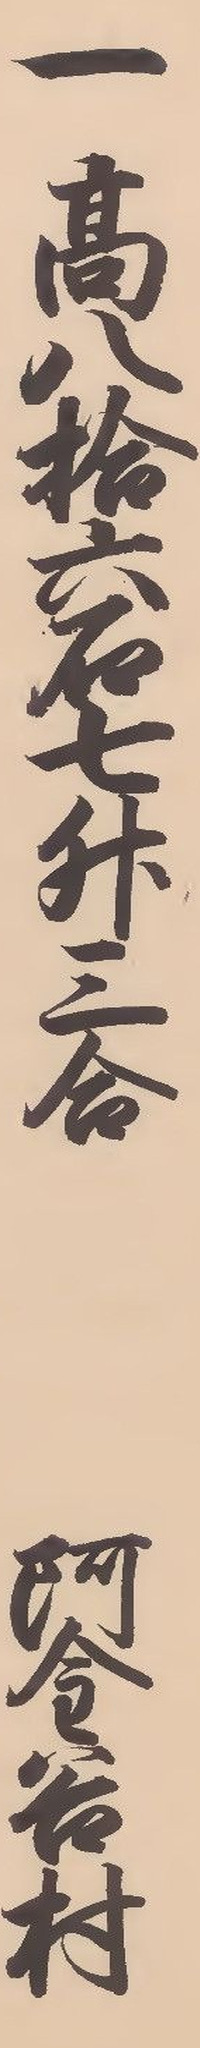一高八拾六石七升三合阿金谷村
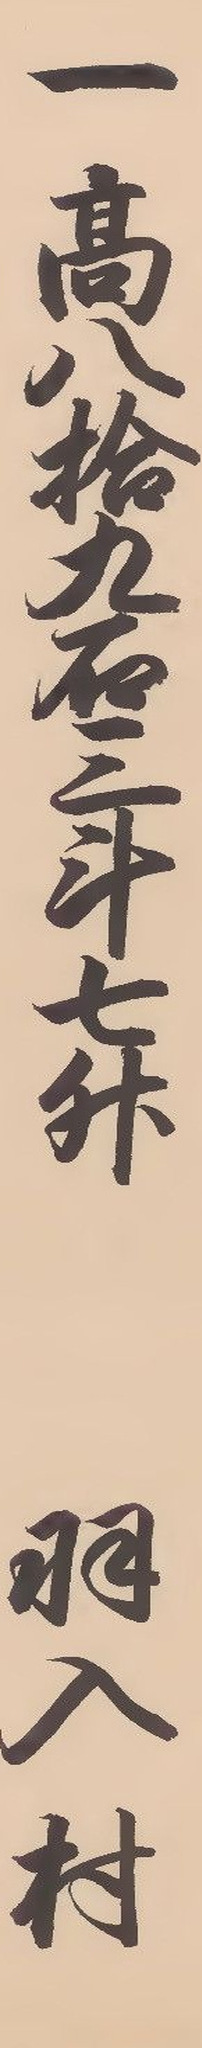一高八拾九石三斗七升羽入村
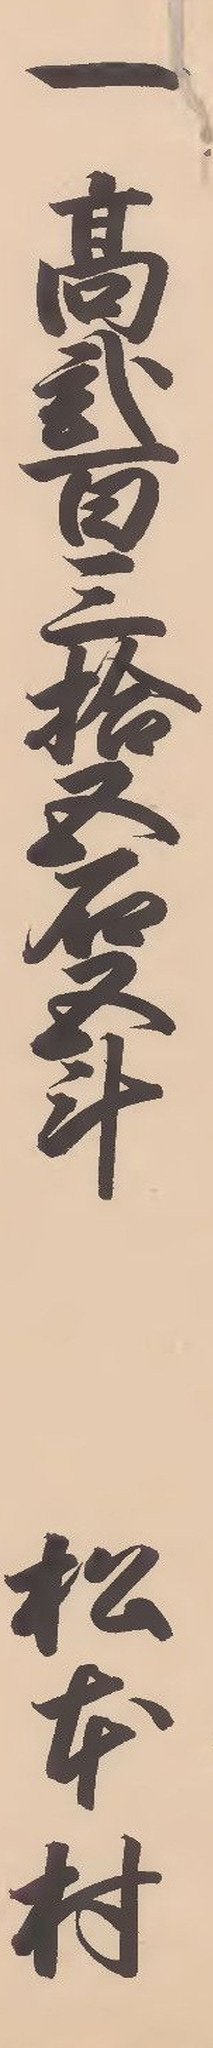一高弐百三拾五石五斗松本村
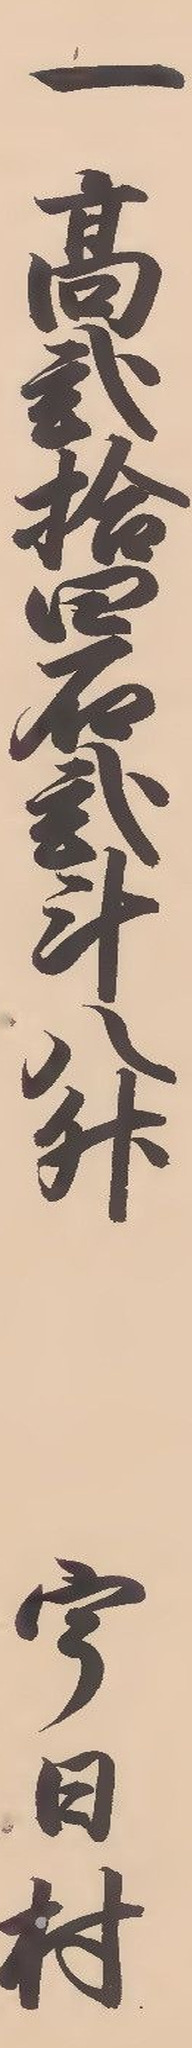一高弐拾四石弐斗八升宇日村
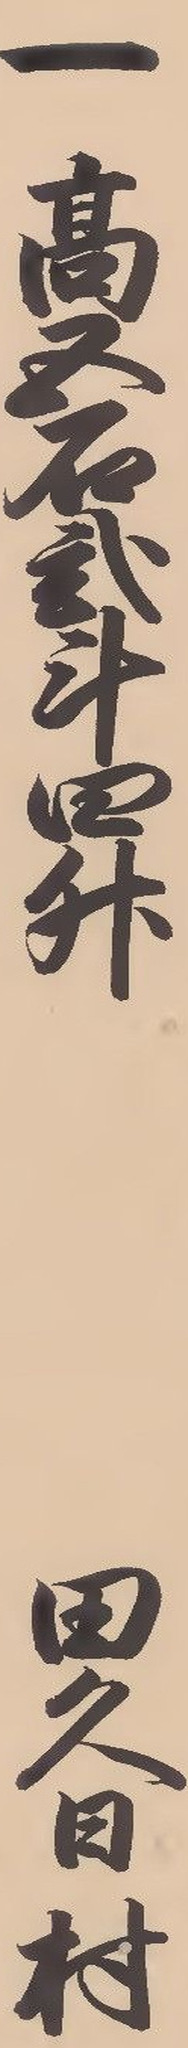一高五石弐斗四升田久日村
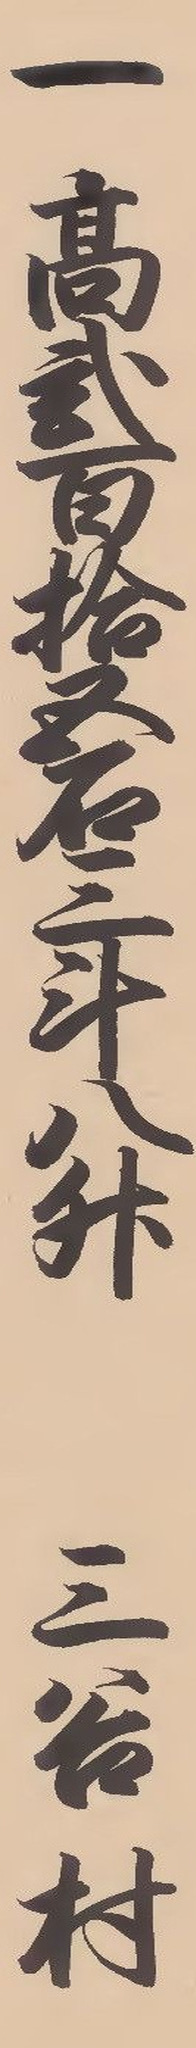一高弐百拾五石三斗八升三谷村
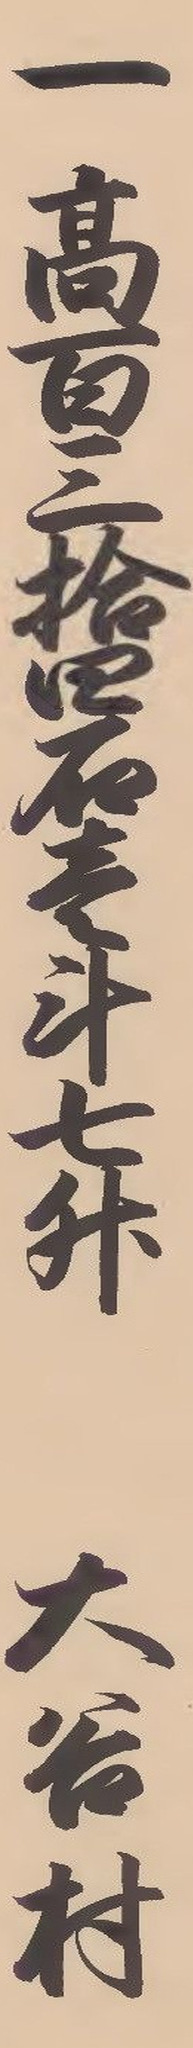一高百三拾四石壱斗七升大谷村

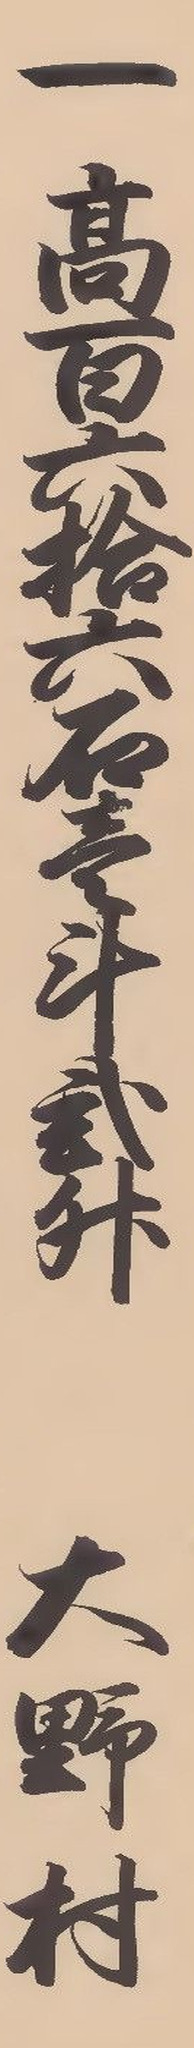一高百六拾六石壱斗弐升大野村
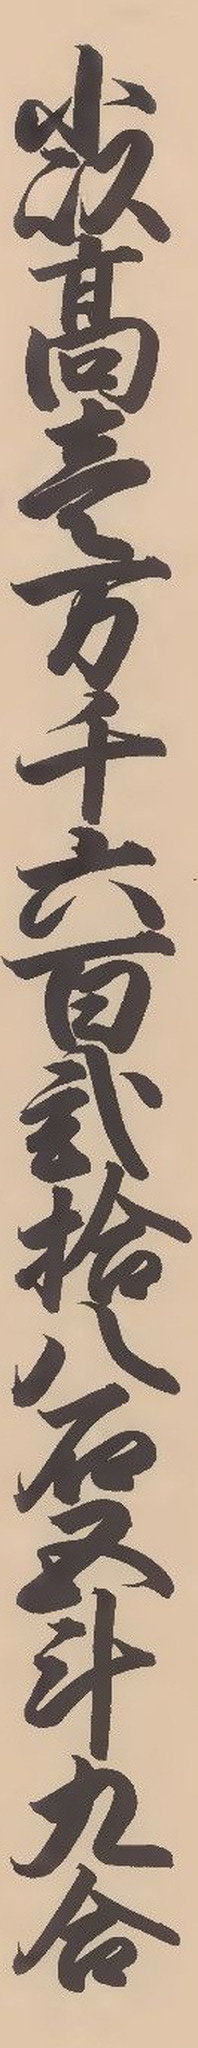小以高壱万千六百弐拾八石五斗九合
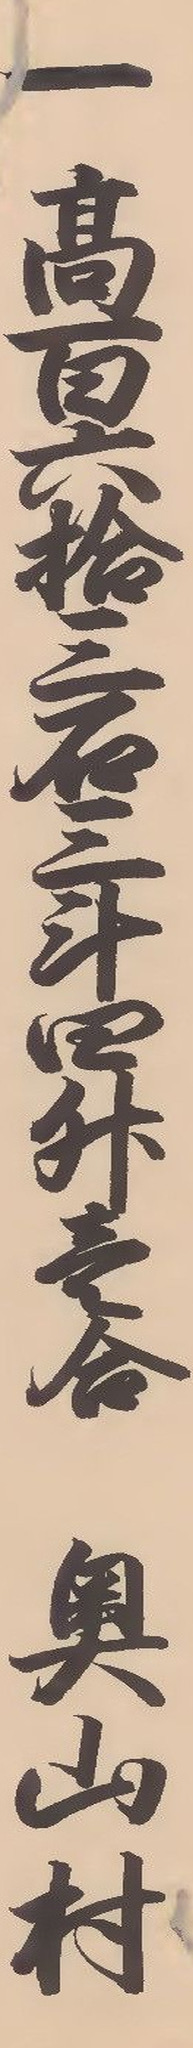一高百六拾三石三斗四升壱合奥山村
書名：但馬国郷帳
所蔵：国立公文書館 National Archives of Japan
